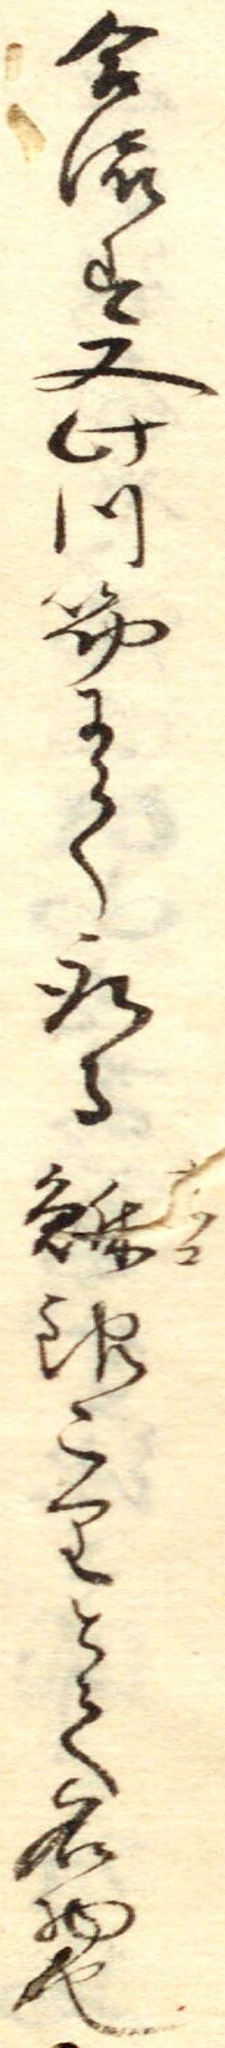合流す又此川筋にて取る鮒銀こりとて名物也
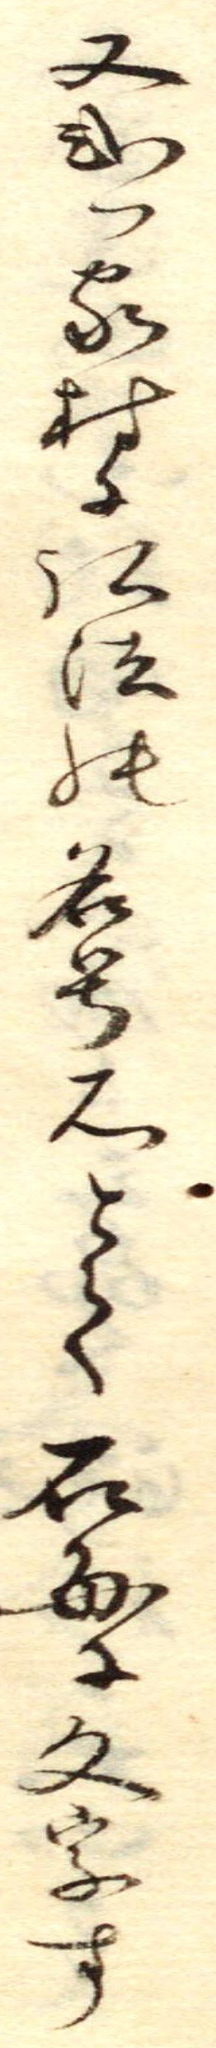又弐っ家村に弘法の名号石とて石毎に文字す
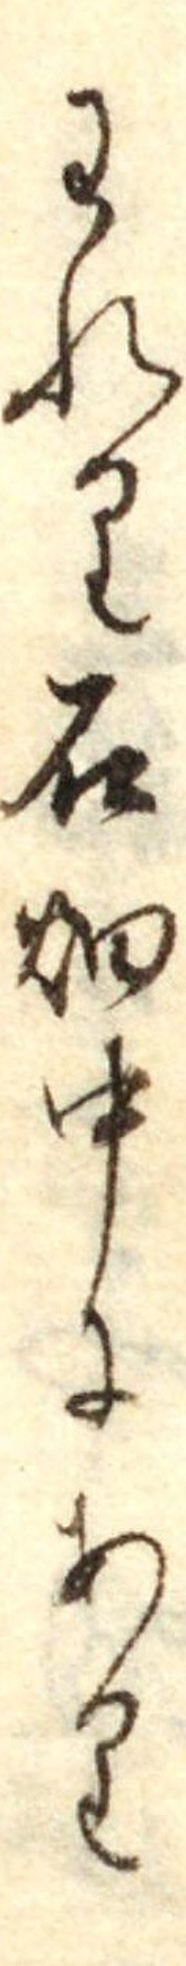われり石畑中にあり
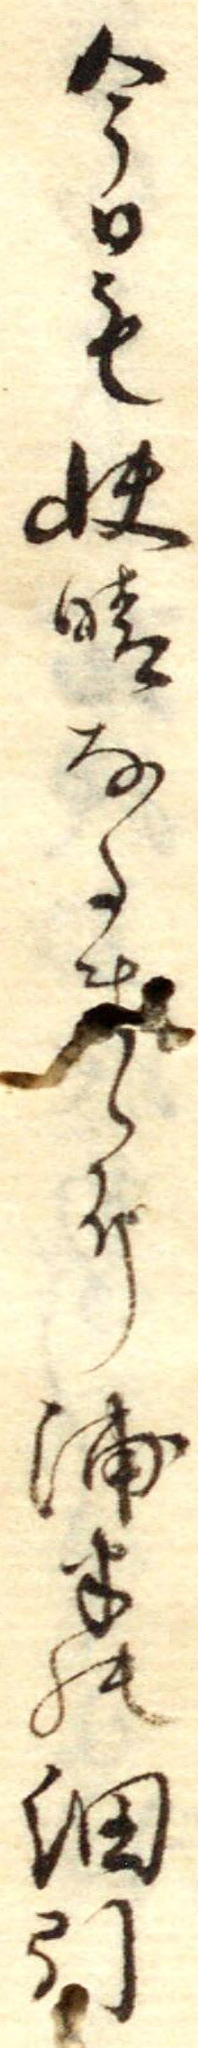今日も快晴なるまゝに浦半の細引
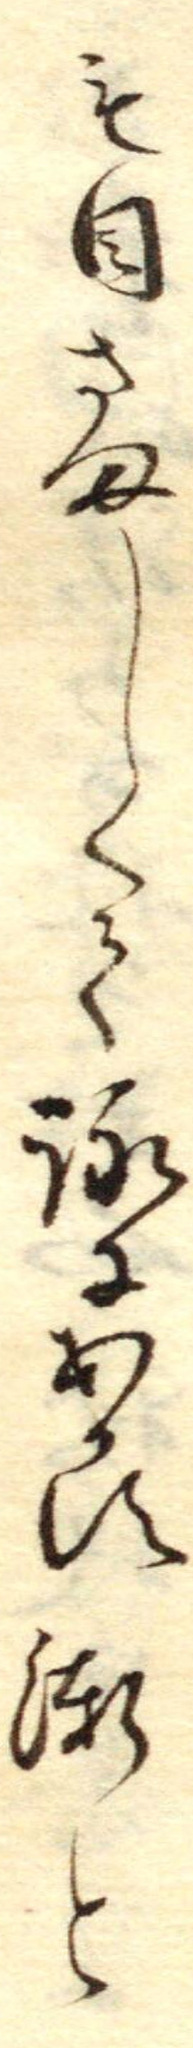も目さましくて詠にあかす漸と

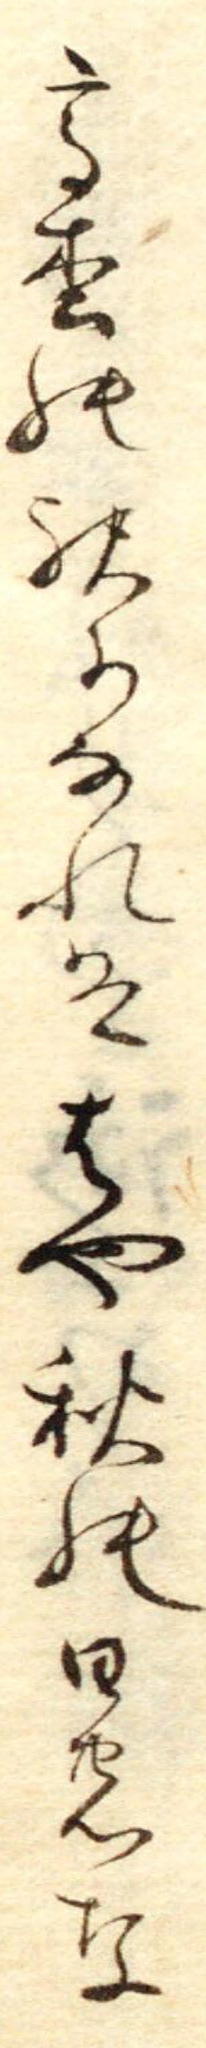高枩の駅になれははや秋の日のな
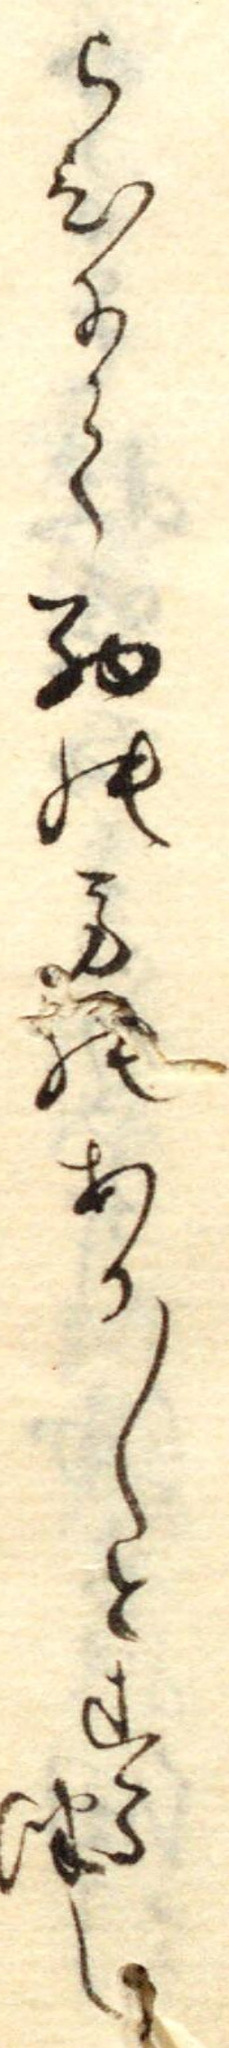らひにて西の方のあか〳〵とする津也
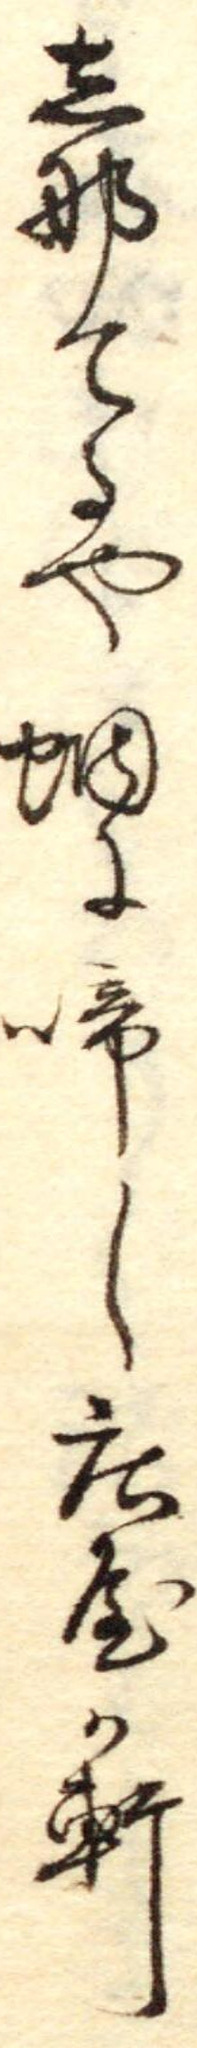しなてるや蜩に啼し庄屋か軒
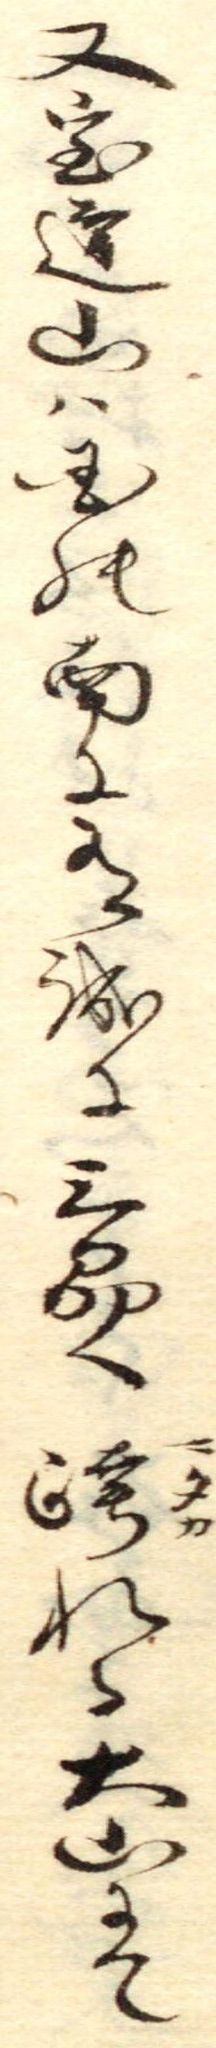又宝達山は国の南に有誠に三州へ跨れる大山にて
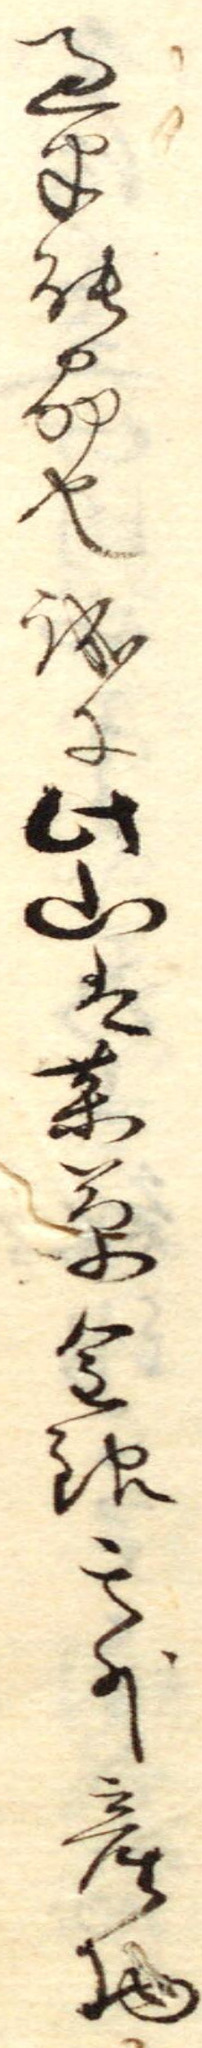過半の州也誠に此山は薬草金銀其外産物
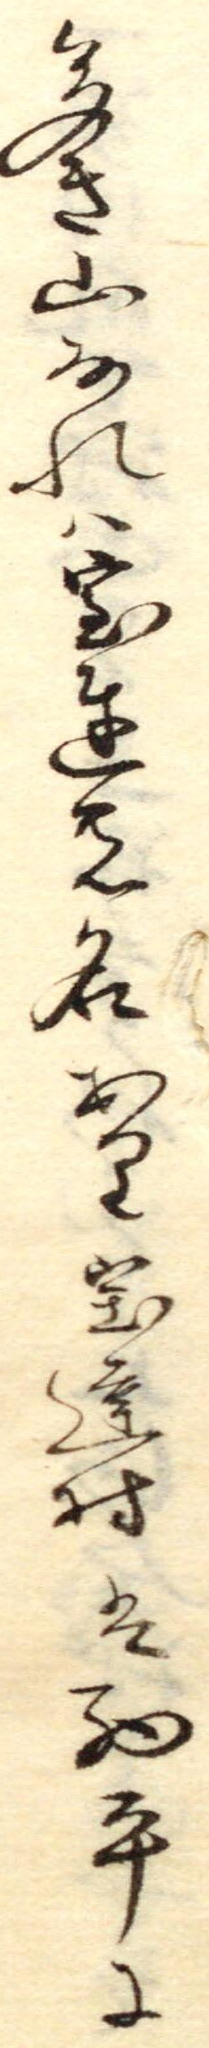多き山なれは宝達の名あり宝達村は西平に
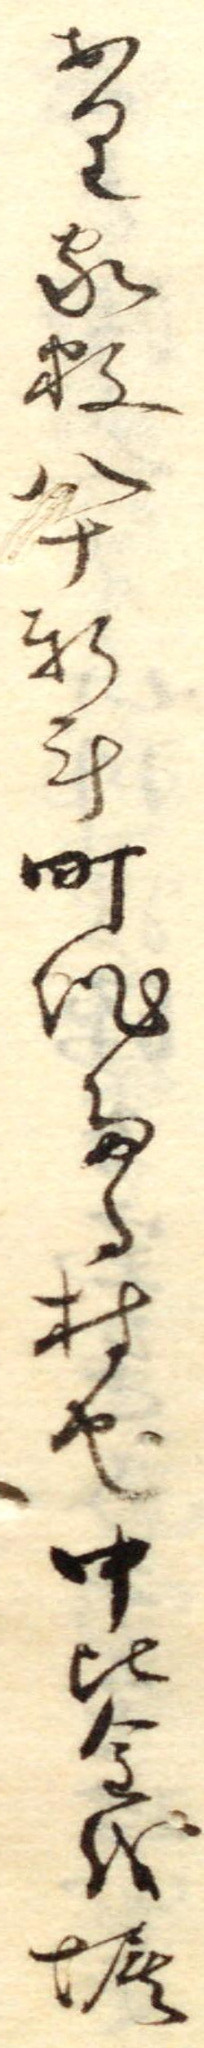あり家数八十軒計町作たる村也中比金を掘
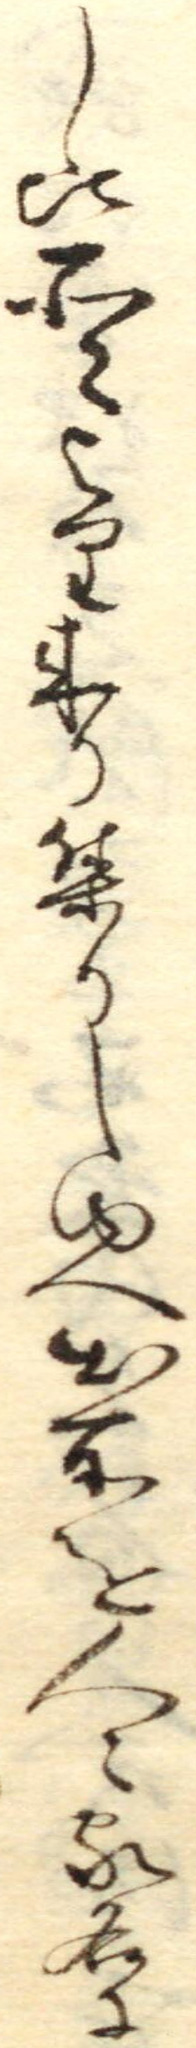し比所々より来り集りしゆへ出所を人々家名に
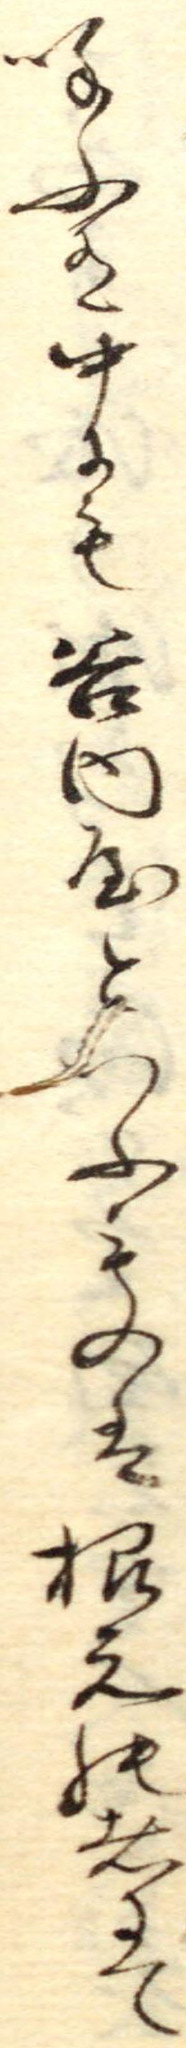呼ふ有中にも谷内屋といふものは根元の者にて
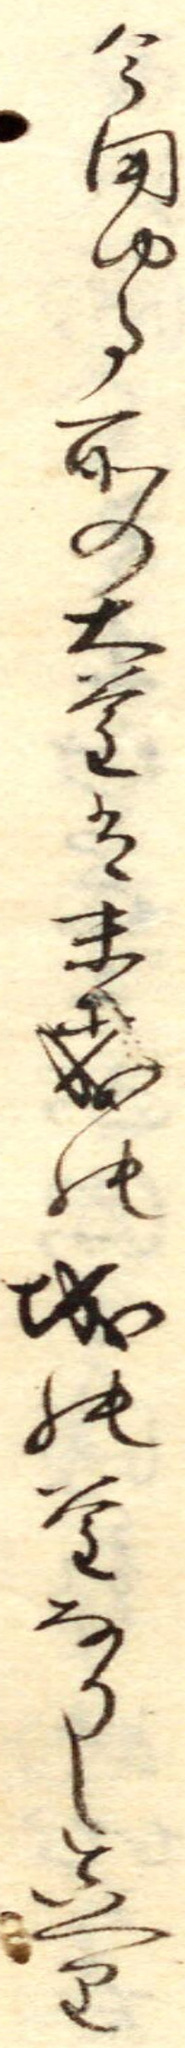今用ゆる所の大釜は末森の城の釜なりしといへり
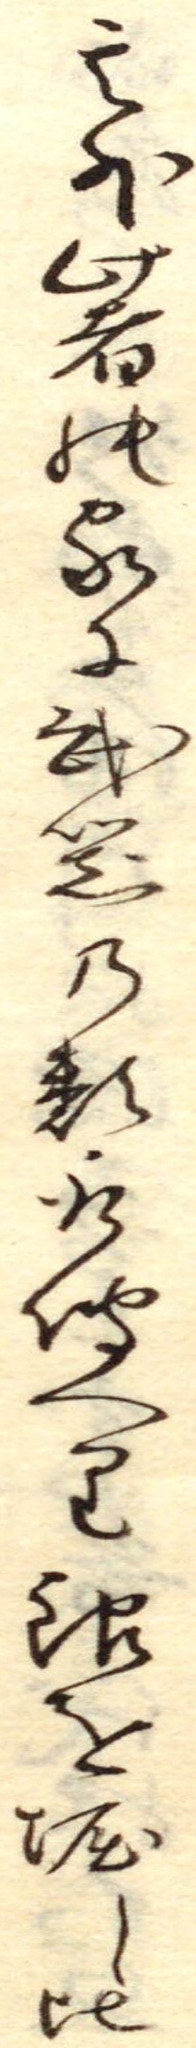其外此者の家に武器の類取伝へり銀を掘し比
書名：能登名跡誌
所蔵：Ishikawa Prefectural Library
